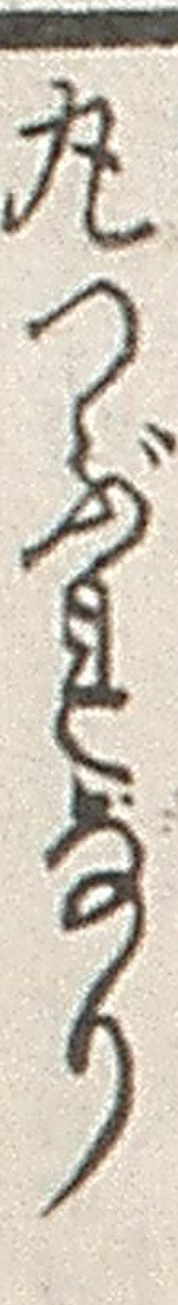丸つぶれなり
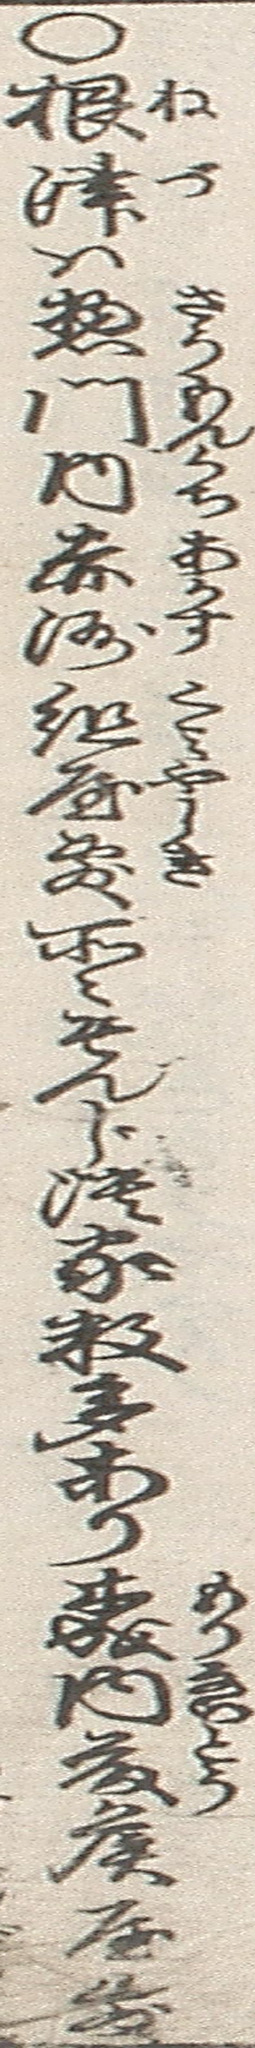◯根津ハ惣山門赤洲組屋敷所々そんじ潰家数多あり森内藤矦屋敷
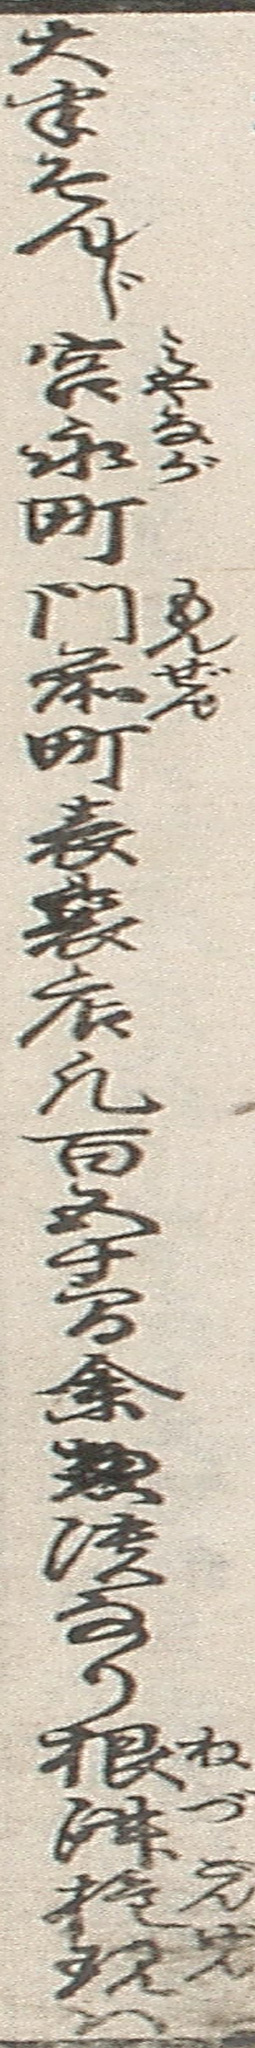大半そんじ宮永町門前町表裏店凡百五十間余惣潰なり根津権現ハ

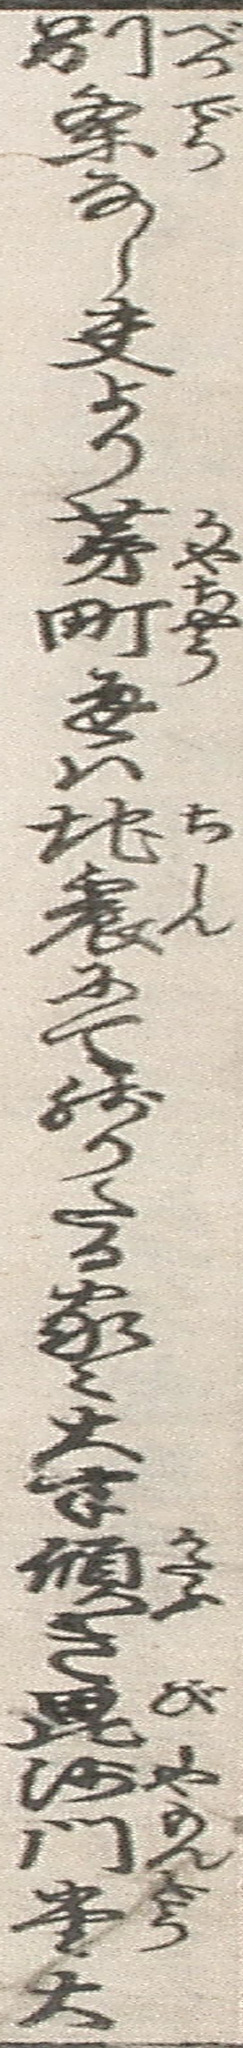別条なし夫より茅町通ハ地震にて残りたる家々大半傾き毘沙門堂大
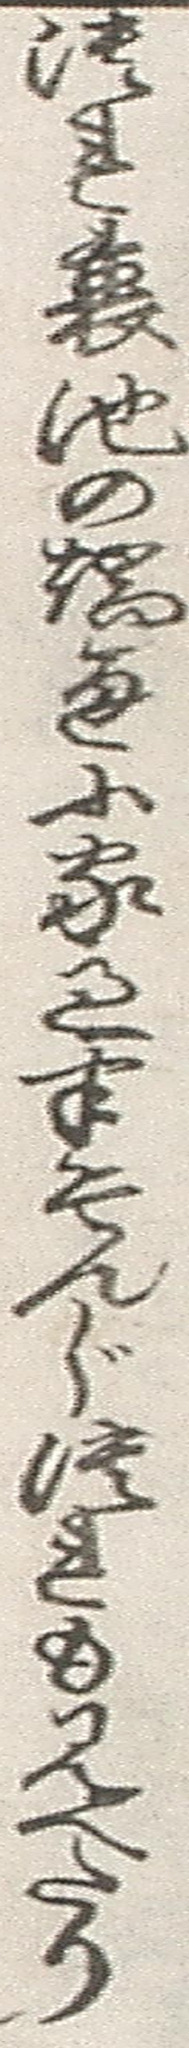潰れ裏池の端通に家過半そんじ潰れも見へたり
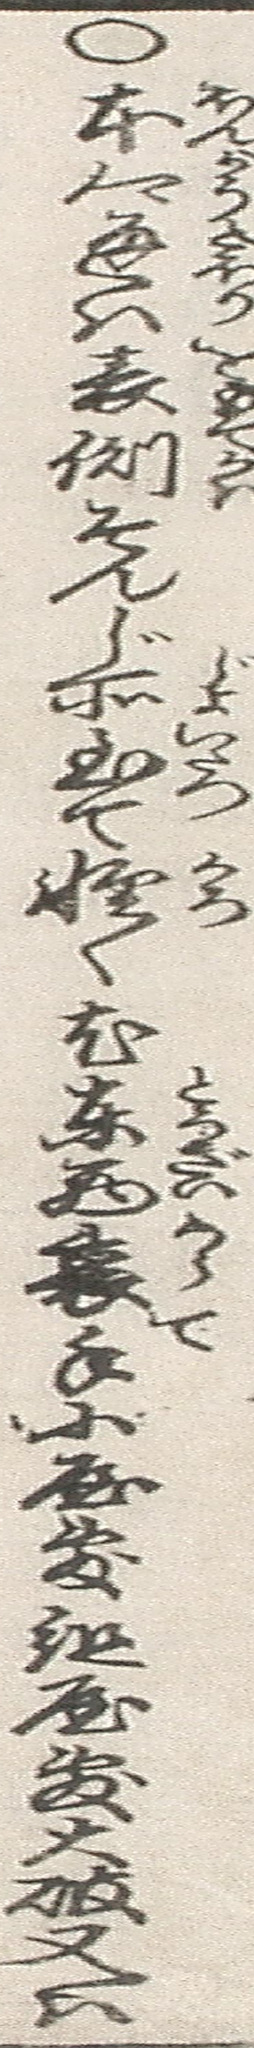◯本郷通りハ表側そんじ所至て軽く尤東西裏手に屋敷組屋敷大破又ハ
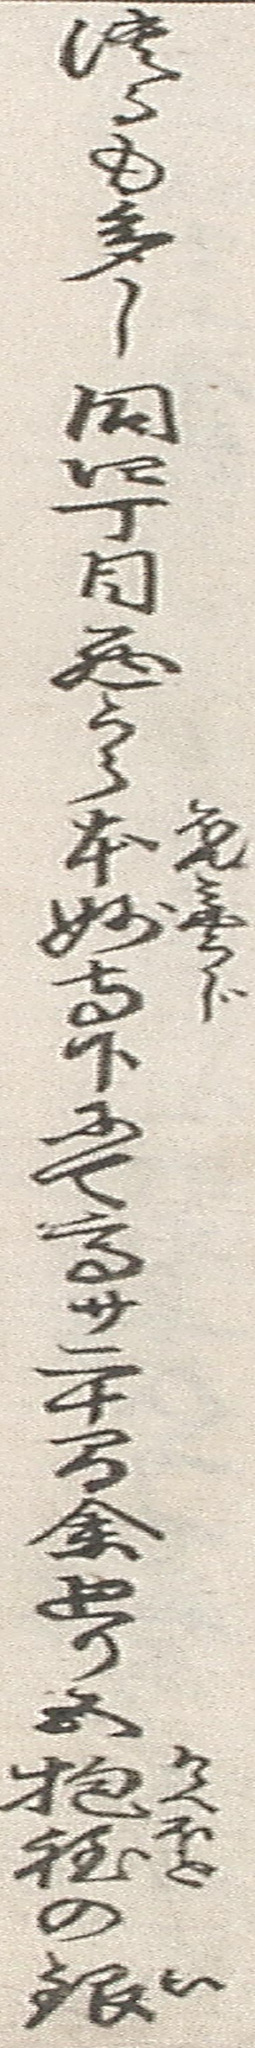潰れも多し同四丁目西から本妙寺下にて高サ二十間廻り五抱程の銀
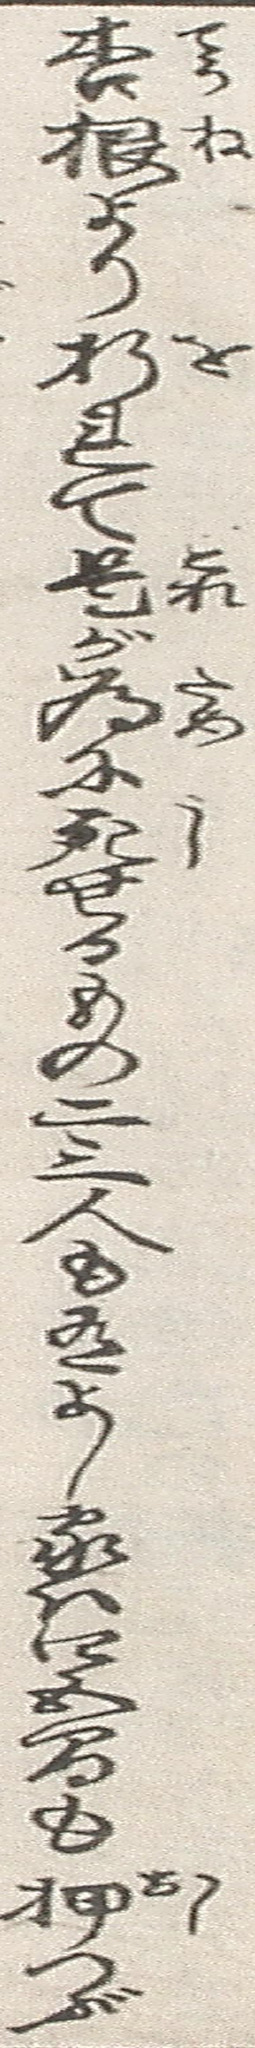杏根より折れて是が為に死せるもの二三人も有よし家ハ四五間も押つぶ
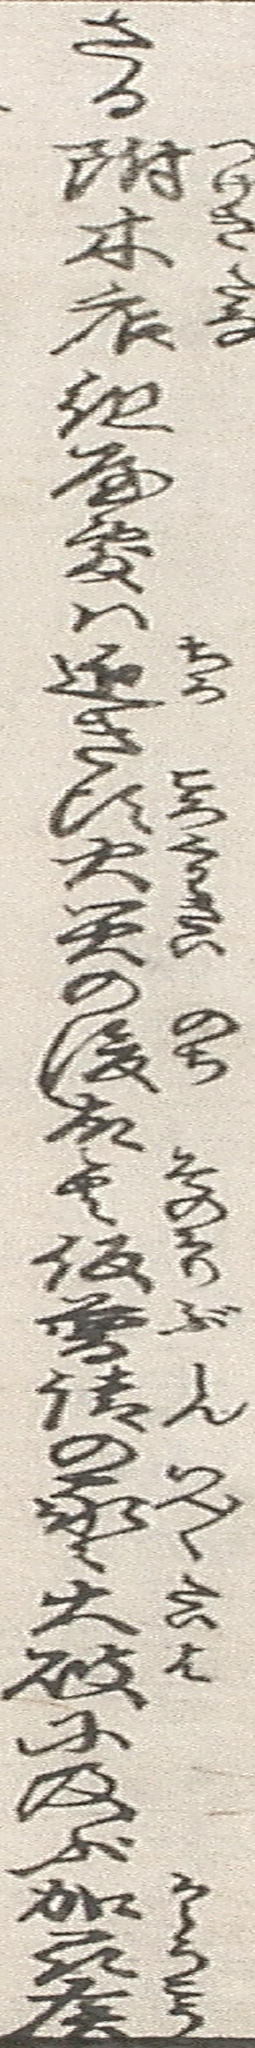さる附木店組屋敷ハ近き頃火災の後故其仮普請の家々大破に及ぶ加州矦
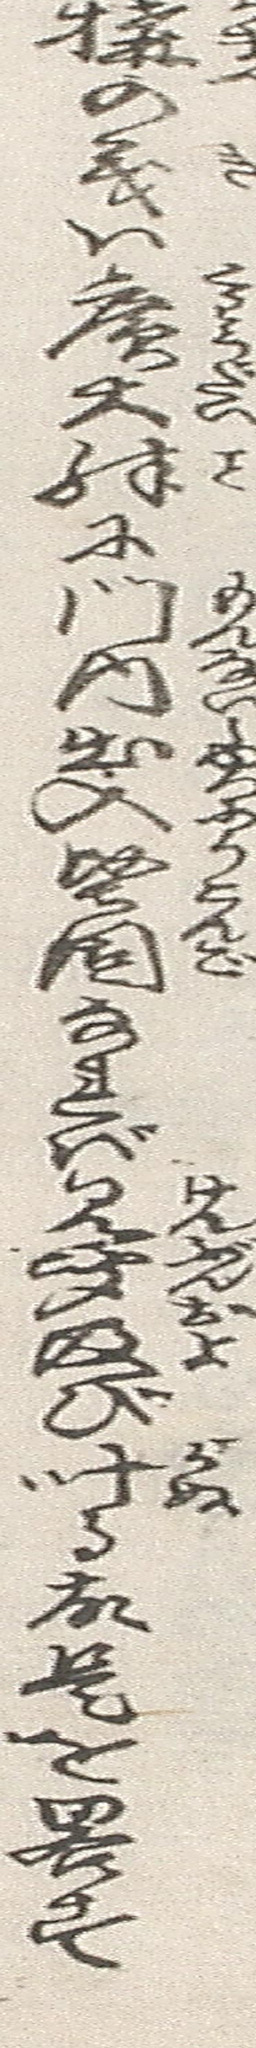構の義ハ広大殊に門内出入堅固なれバ見聞及び叶る故是を略す
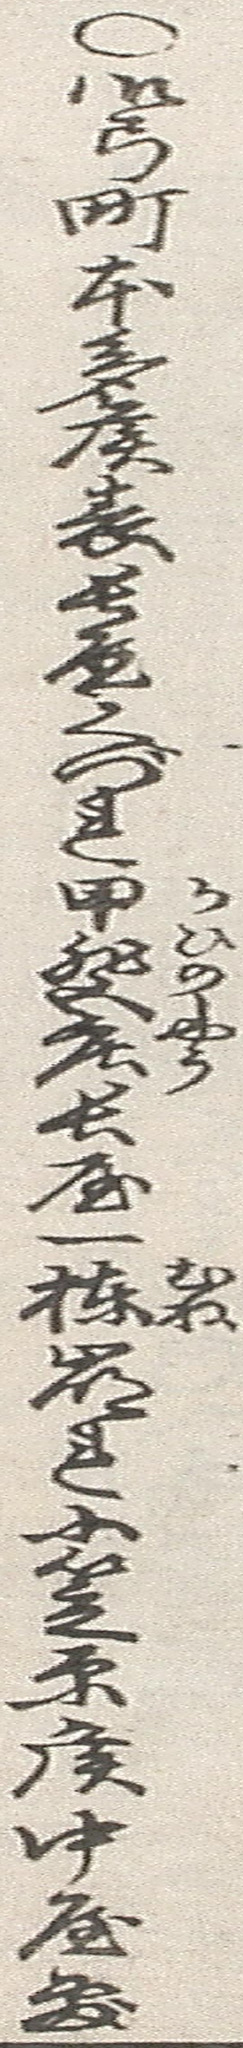◯御弓町本多矦表長屋くづれ甲斐庄長屋一棟崩れ小笠原矦中屋敷
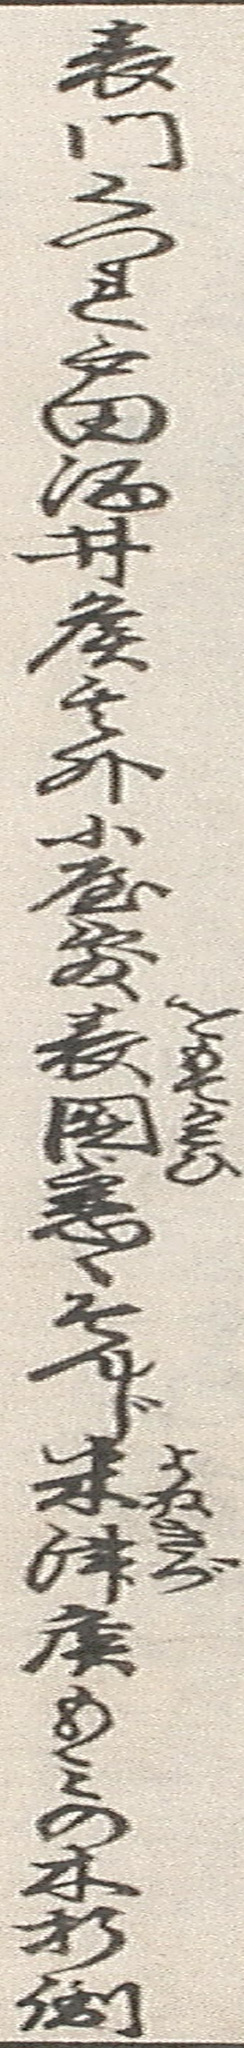表門くつれ戸田酒井矦其外小屋敷表囲悉くそんじ米津矦もミの木打倒
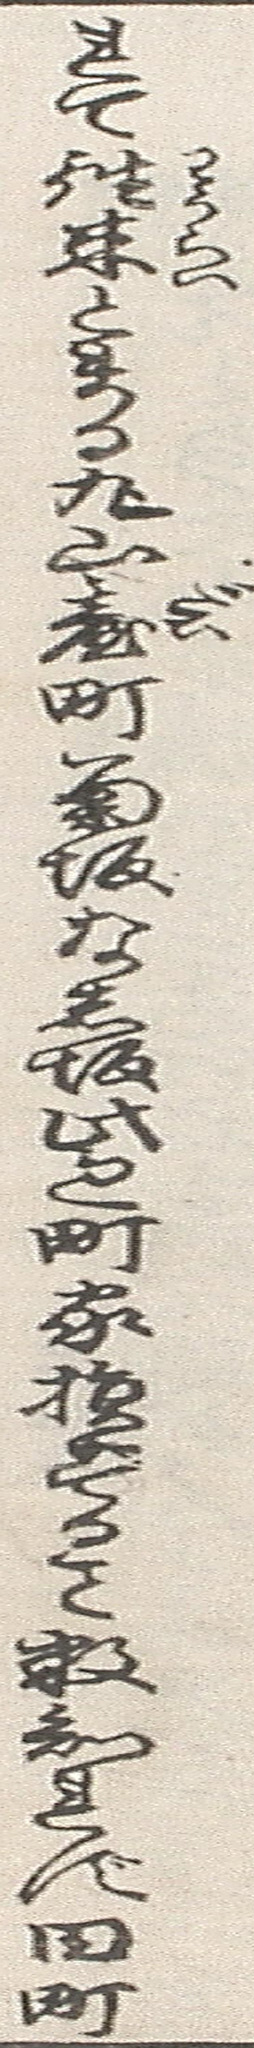れて往来とまる丸山台町菊坂なし坂此の辺町家損ずること数知れず田町
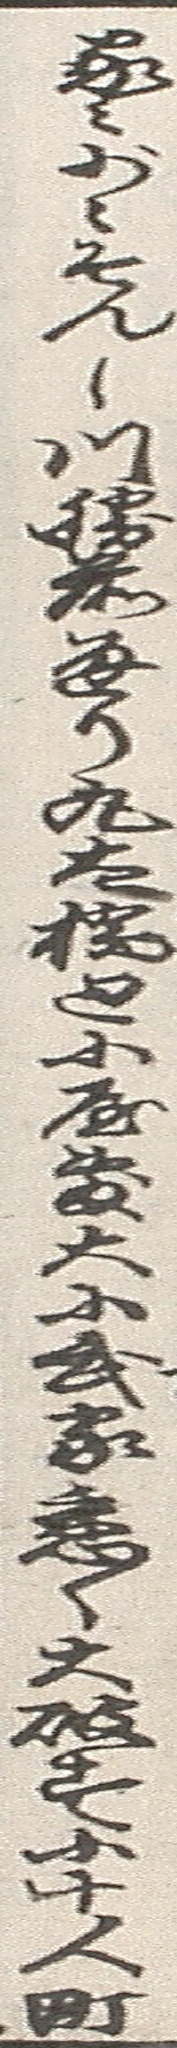家少々そんし川勝前通り丸太橋辺小屋敷大小武家悉く大破す小十人町
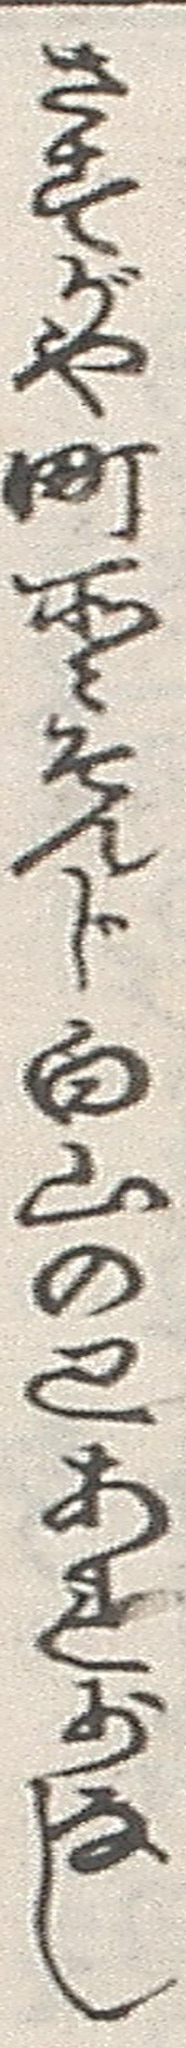さそがや町所々そんじ白山のみあれ少なし
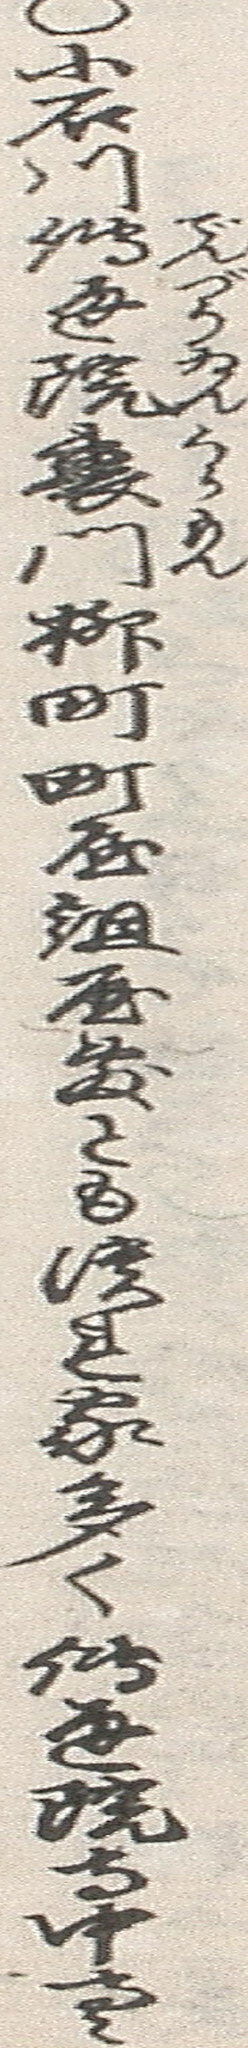◯小石川伝通院裏門柳町町屋組屋敷とも潰れ家多く伝通院寺中寺々
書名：安政風聞集　上中下　全
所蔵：東京大学地震研究所図書室 Earthquake Research Institute Library, The University of Tokyo, JAPAN
